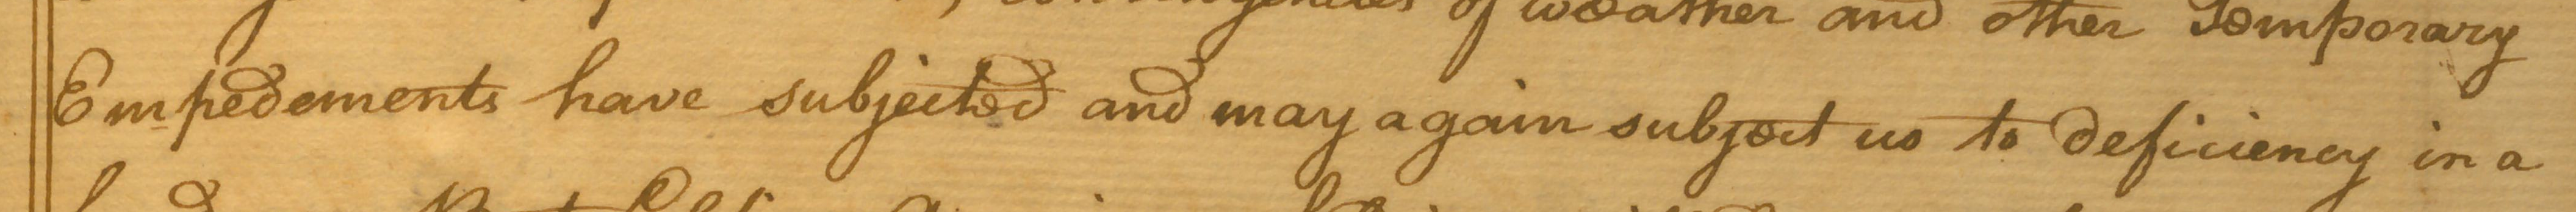Empedements have subjected and may again subject us to deficiency in a
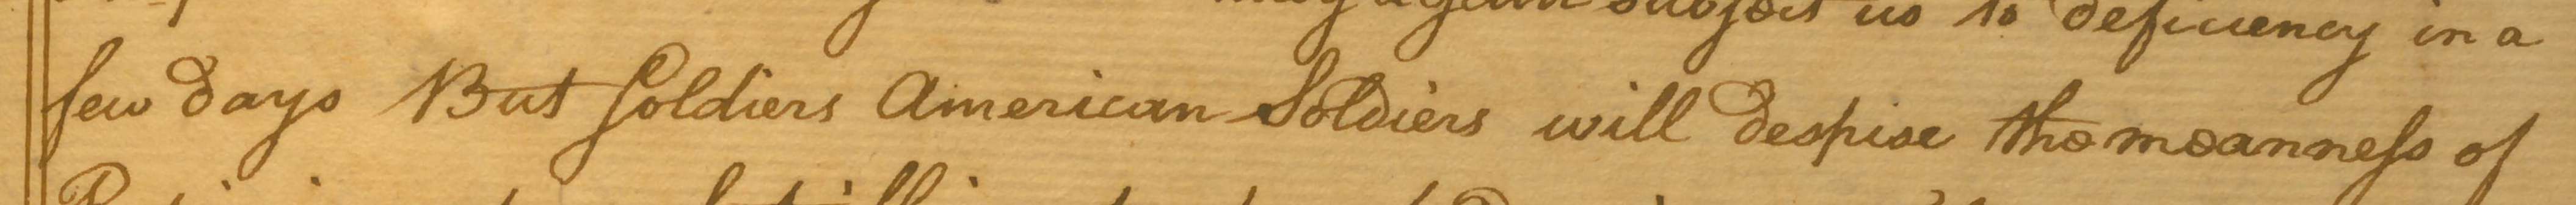few days But soldiers American soldiers will despise the meanness of
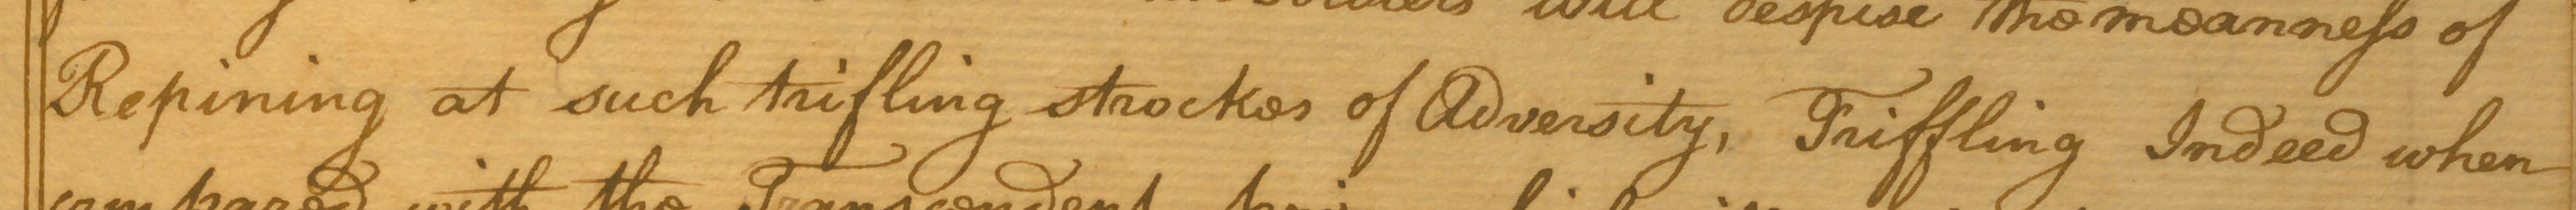Repining at such trifling strockes of Adversity, Triffling Indeed when
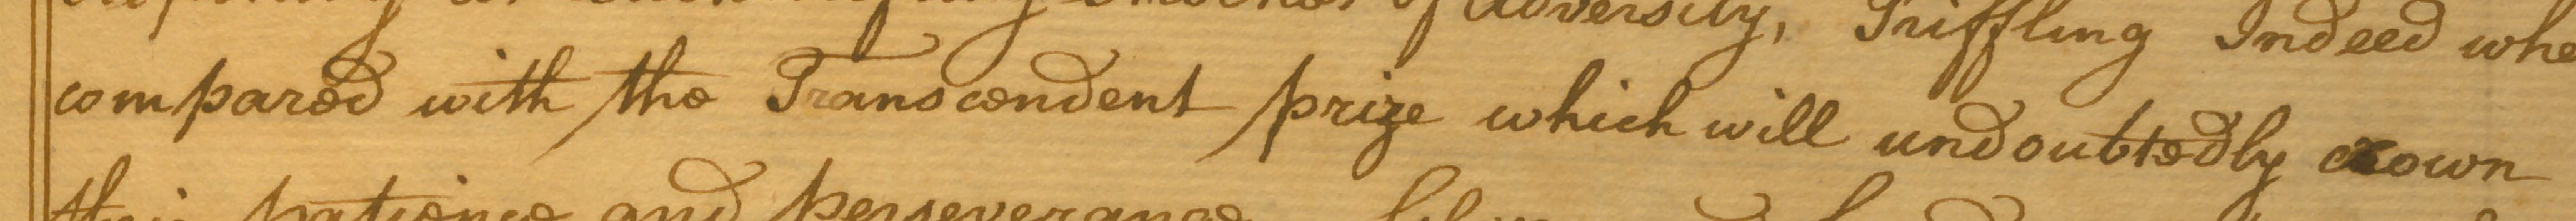compared with the Transcendent prize which will undoubtedly crown
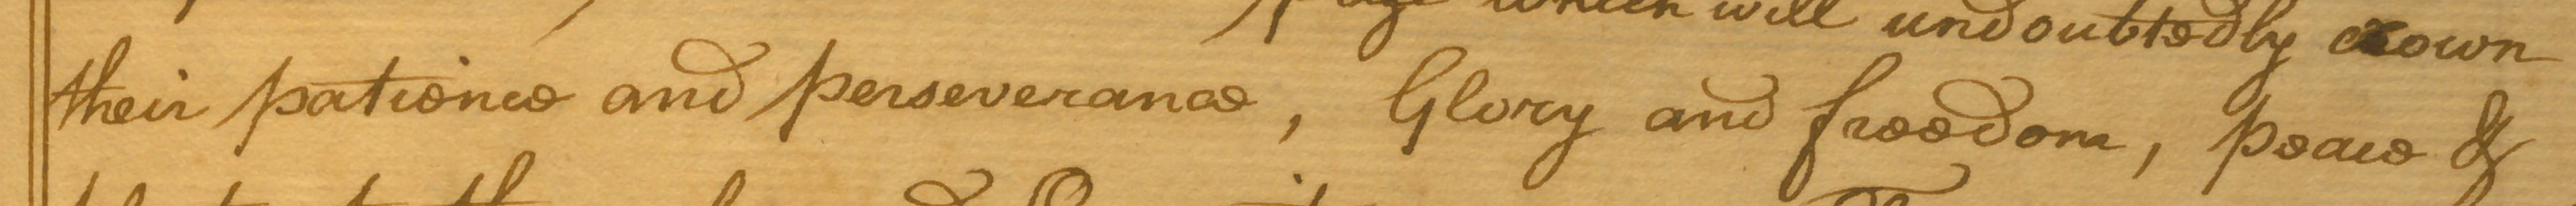their patience and perseverance, Glory and freedom, peace &
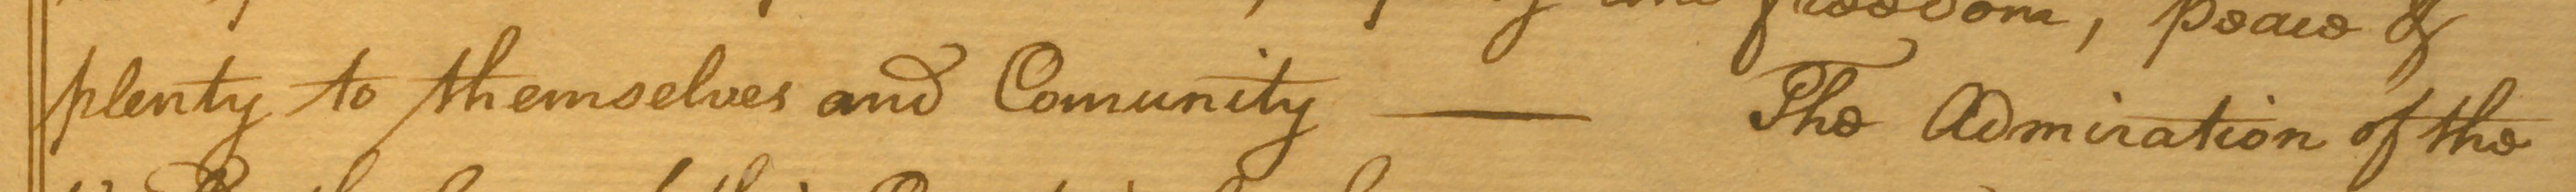plenty to themselves and Comunity- The Admiration of the
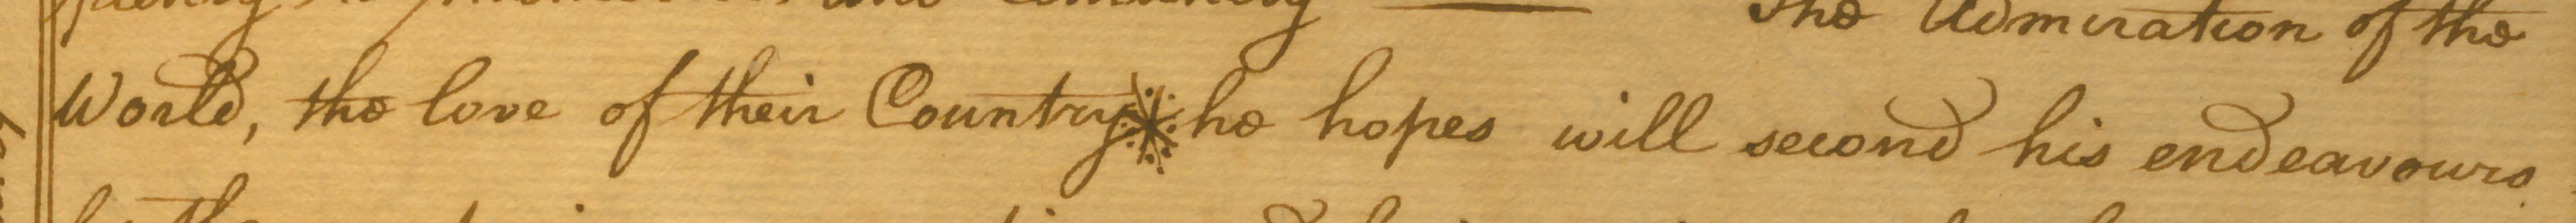world, the love of their Country* he hopes will second his endeavours
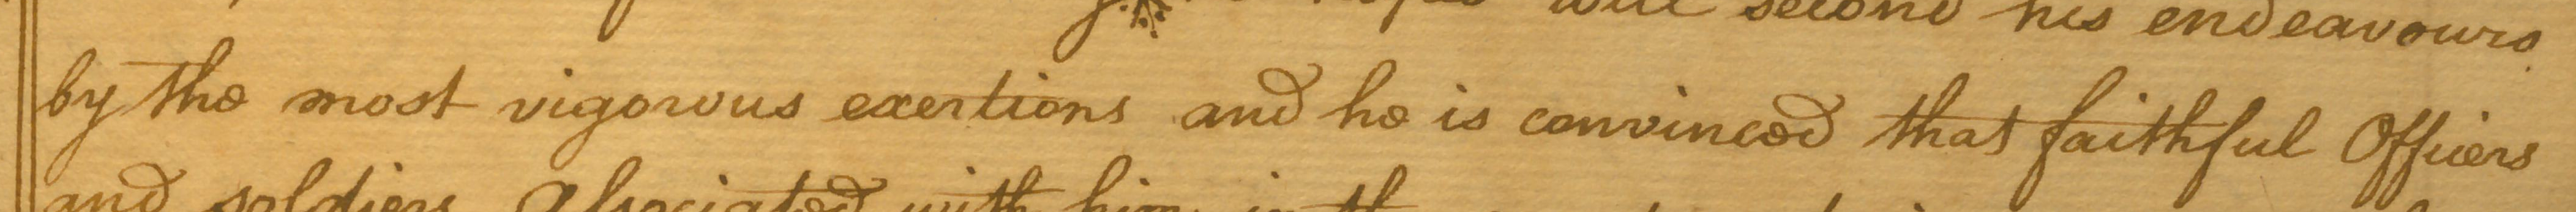by the most vigorous exertions and he is convinced that faithful Officers
